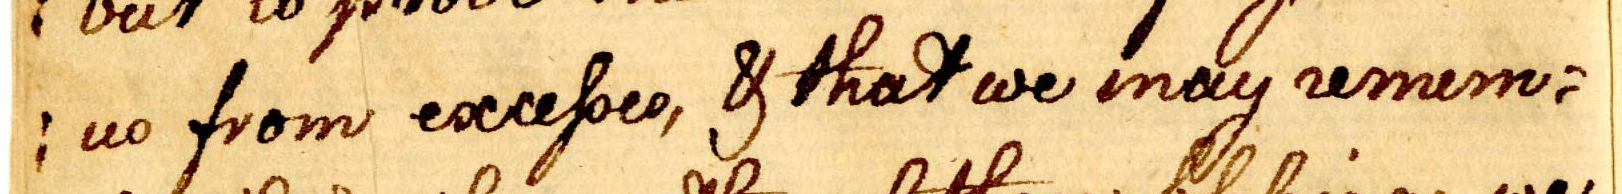"us from excesses, & that we may remem-
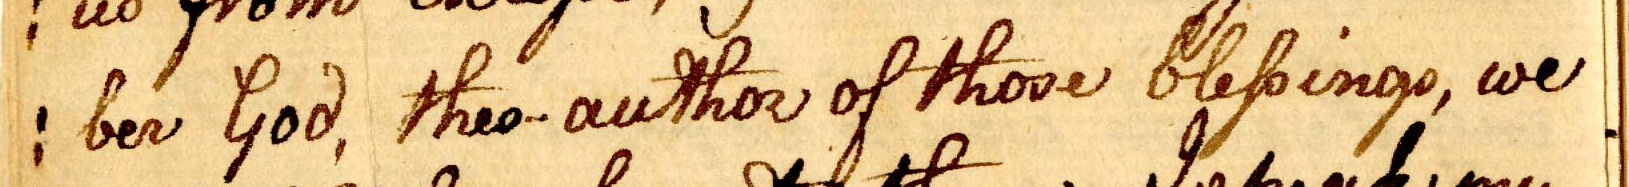"ber God, thes author of those blessings, we
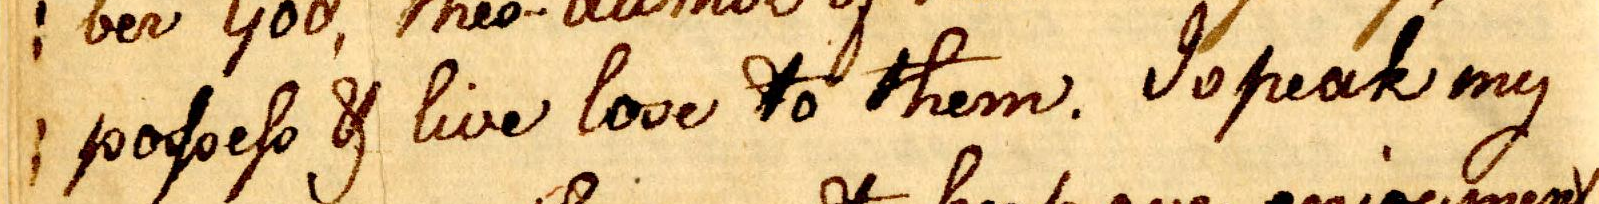"possess & live lose to them, I speak my
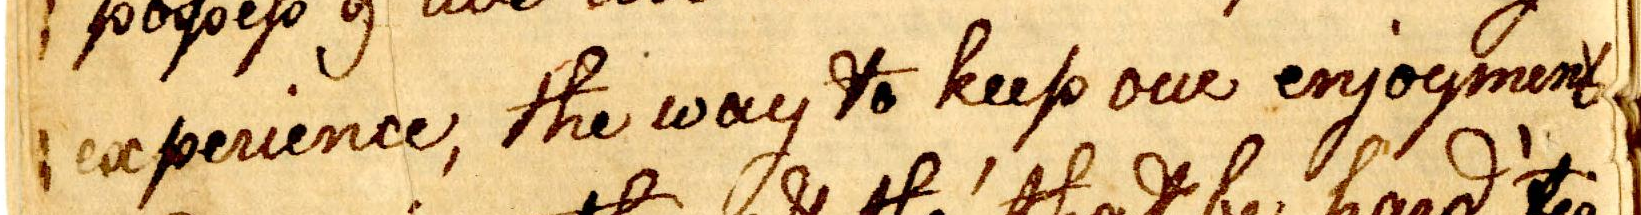"experience the way to keep our enjoyment
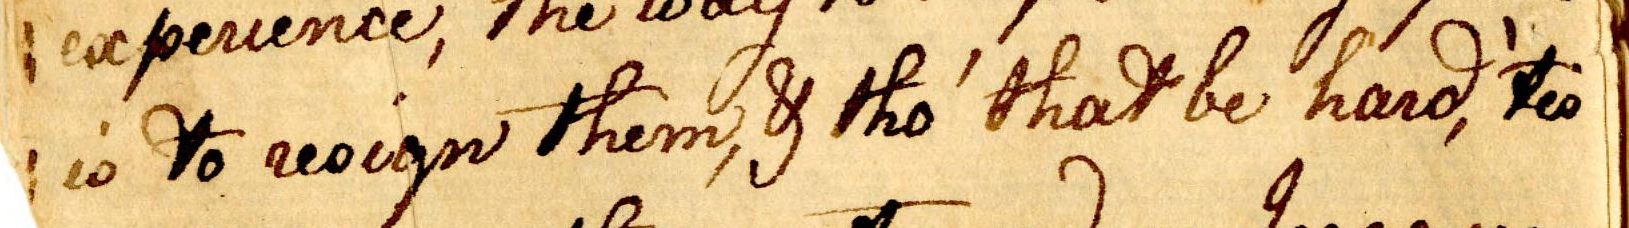"is to resign them, & tho' that be hard, 'tis
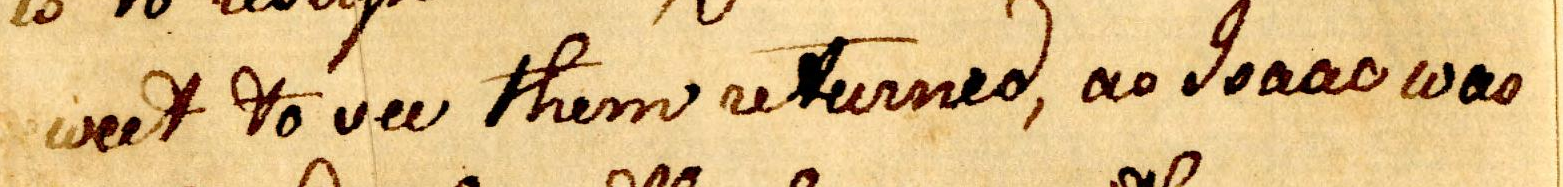went to see them returned, as Isaac was
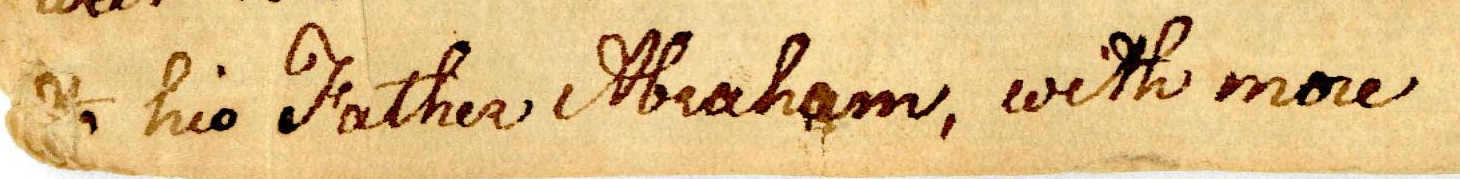to his Father Abraham, with more
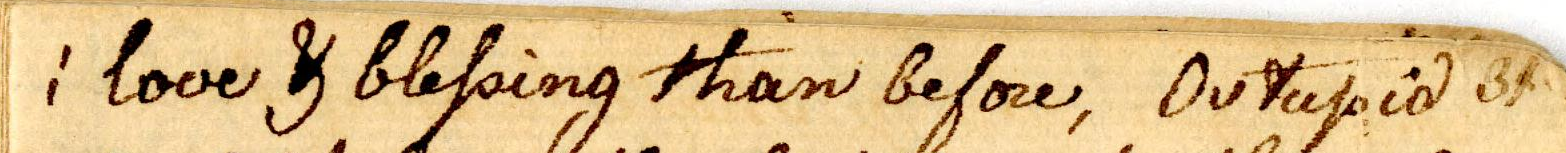"love & blessing than before, O stupid
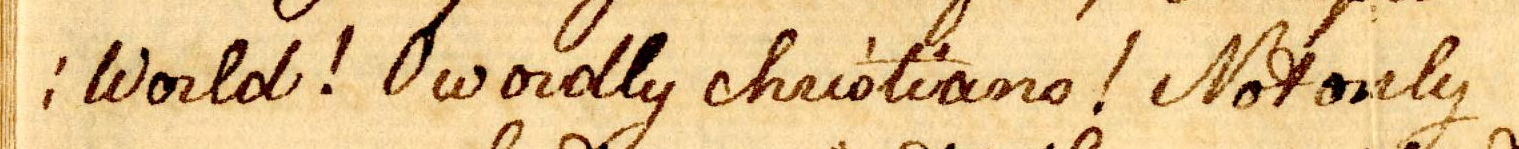"World! O wordly christians! Not only
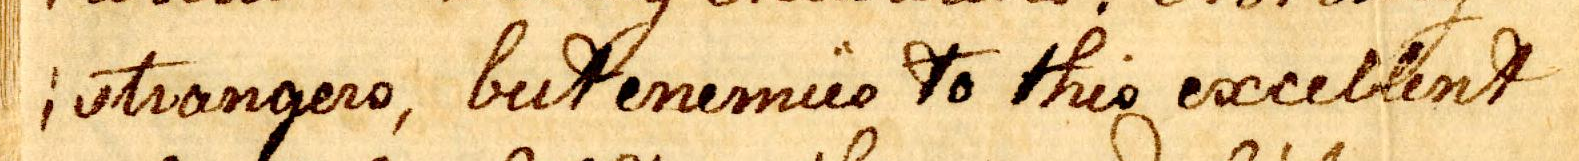"strangers, but enemies to this excellent
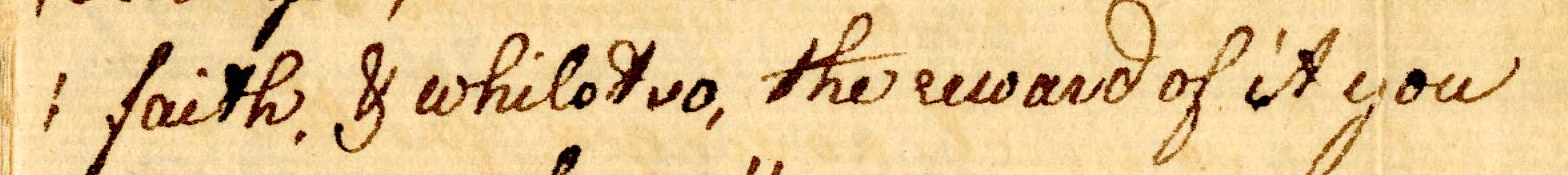"faith, & whilst so, the reward of it you
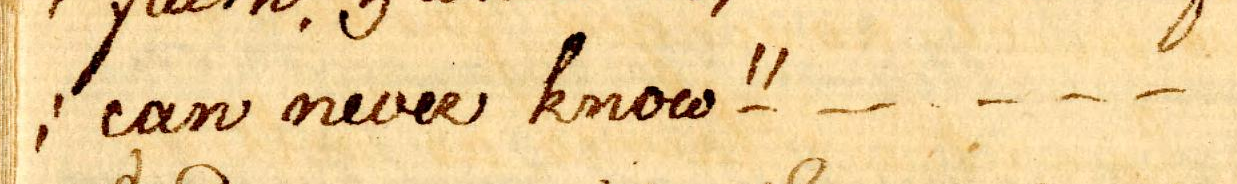"can never know"----
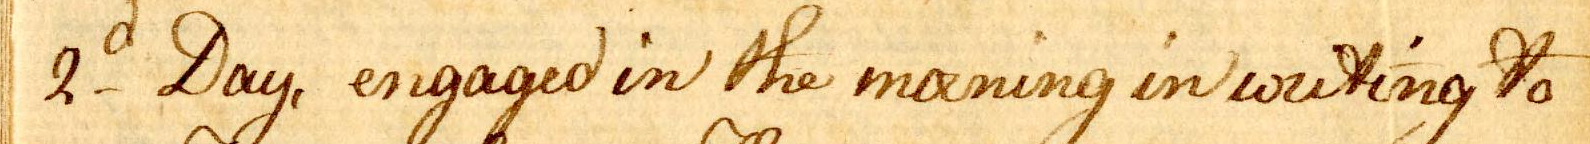2^d Day, engaged in the morning in writing to
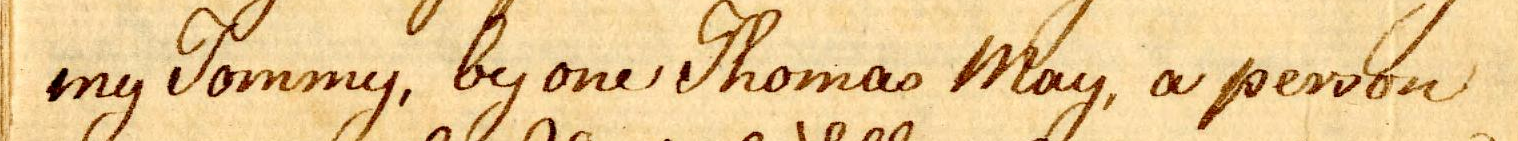my Tommy, by one Thomas May, a person
